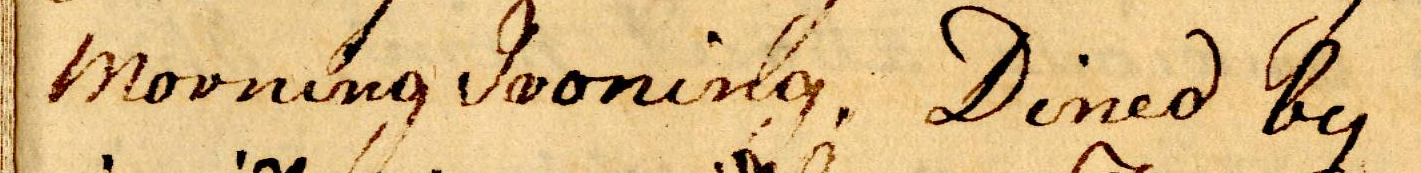Morning Ironing, Dined by
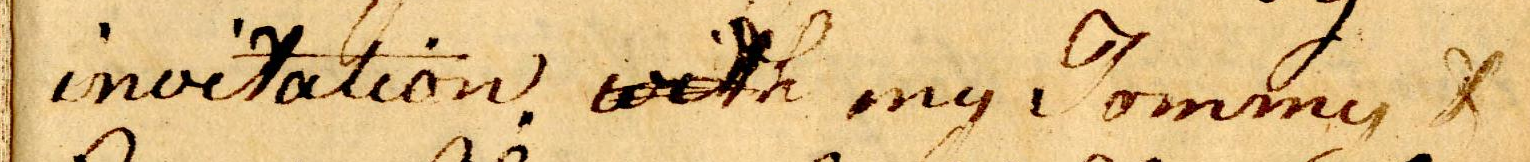invitation with my Tommy &
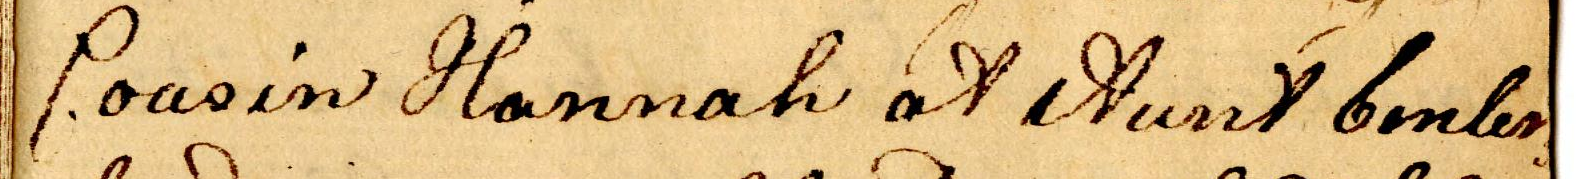Cousin Hannah at Aunt Emlen
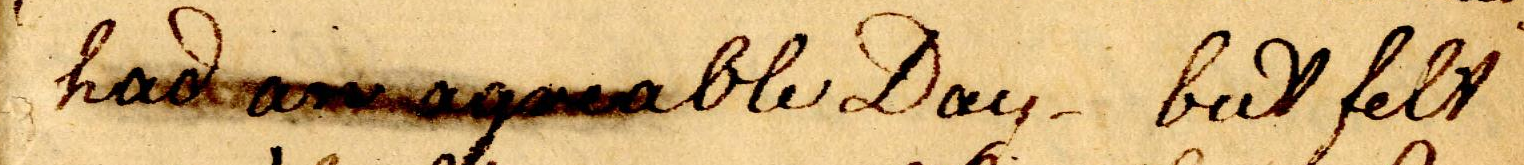had an agreable Day- but felt
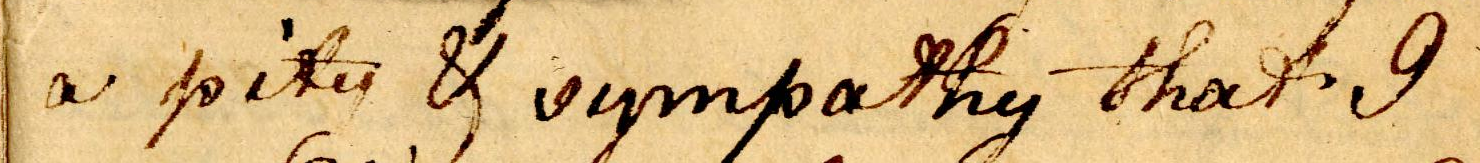a pity & sympathy that I
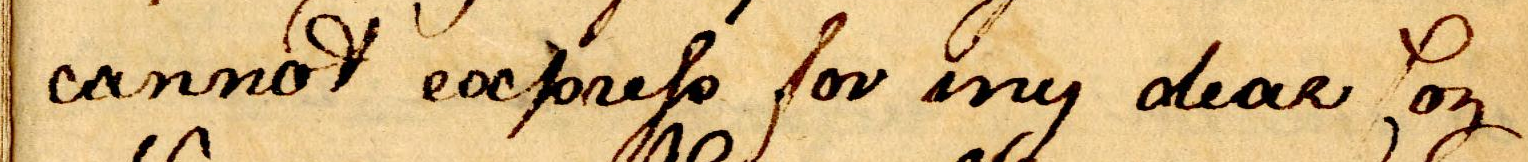cannot express for my dear Coz
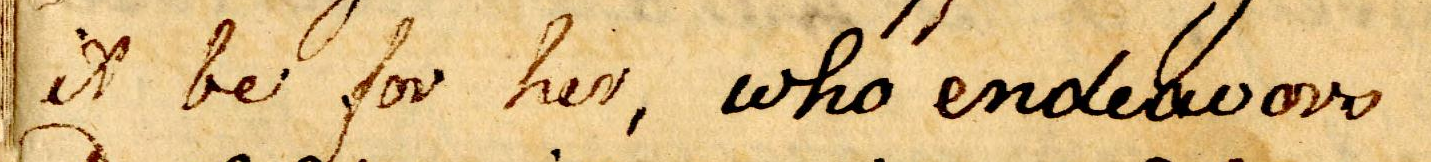it be for her, who endeavors
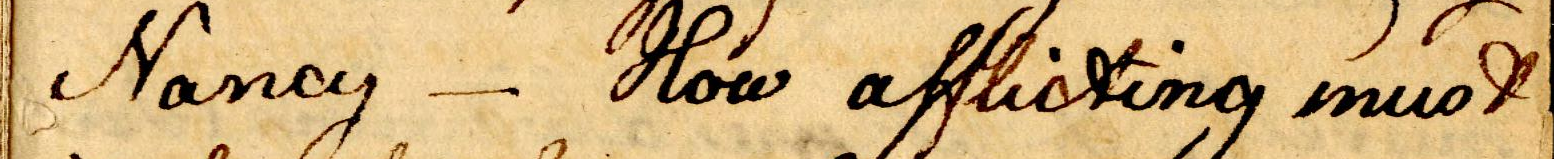Nancy- How afflicting must
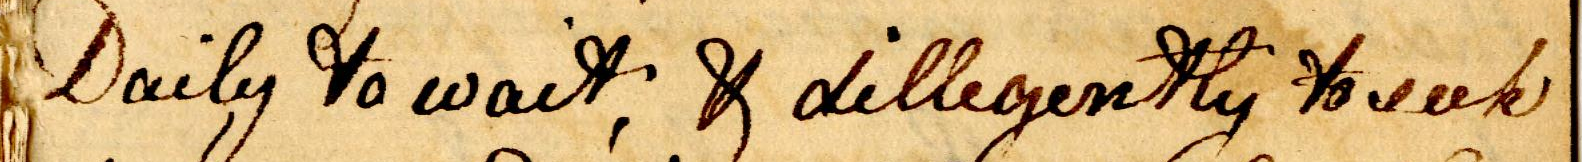Daily to wait, & dillegently to seek
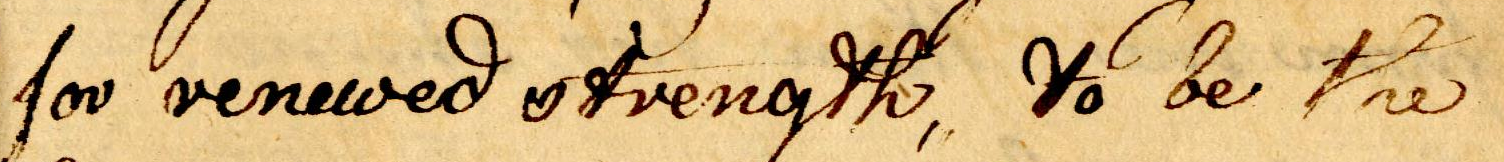for renewed strength, to be the
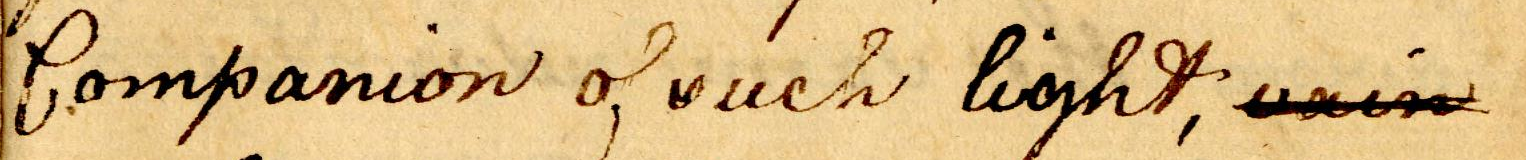Companion of such light, [vain]
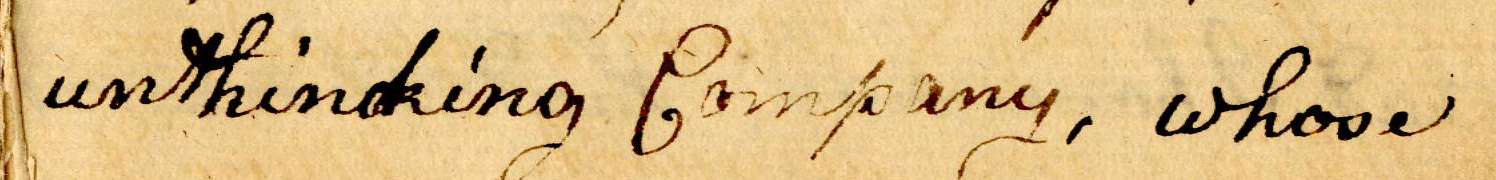unthinking Company, whose
